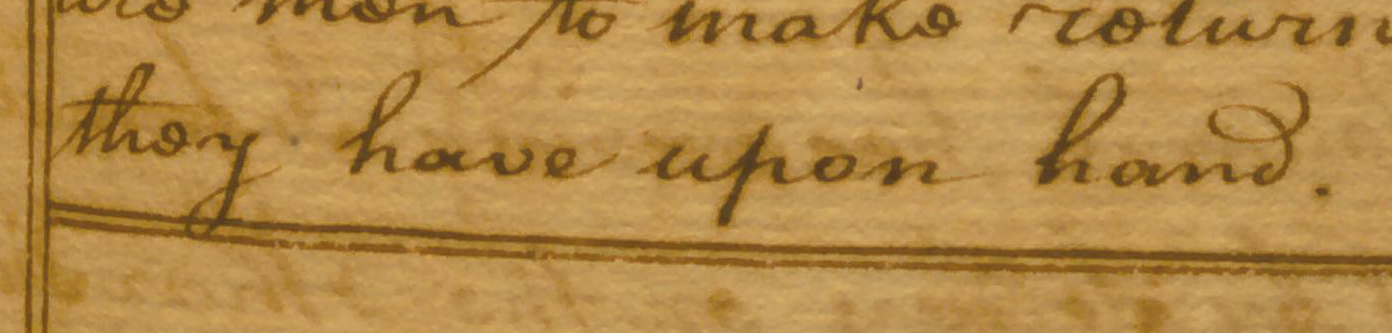they have upon hand.
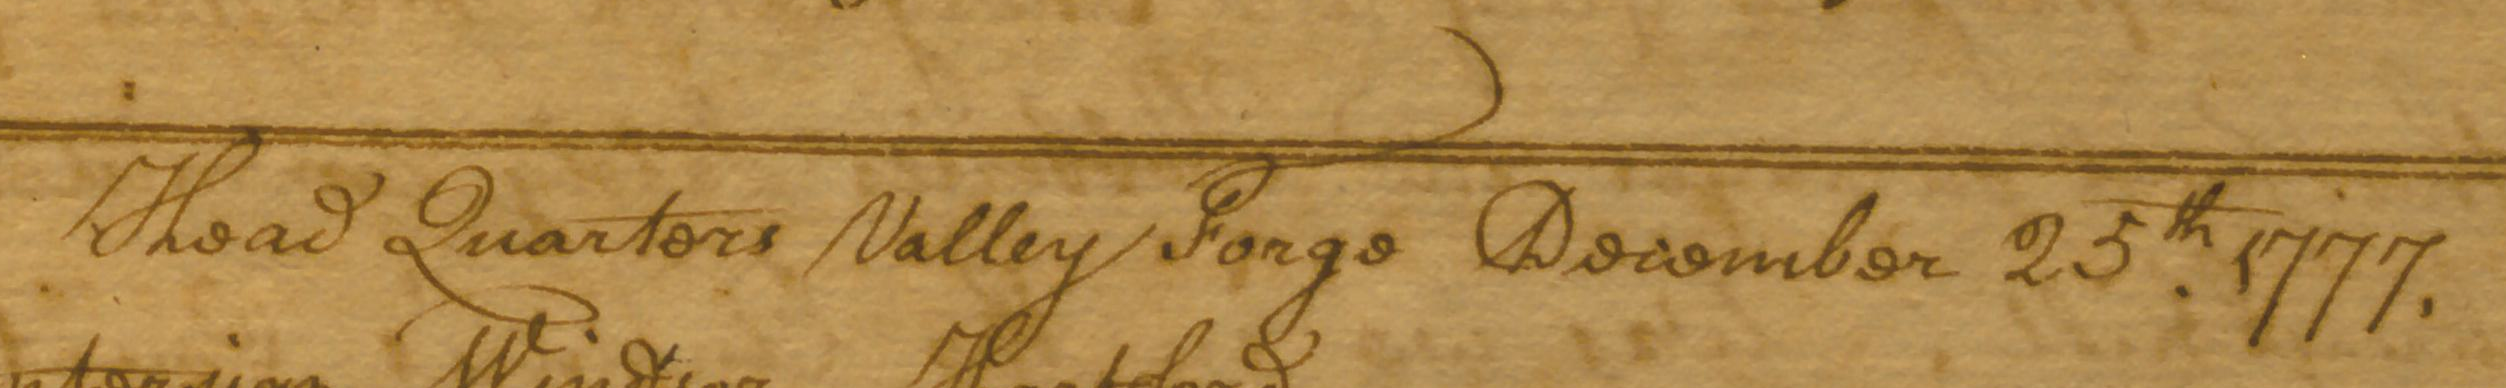Head Quarters Valley Forge December 25^th. 1777.
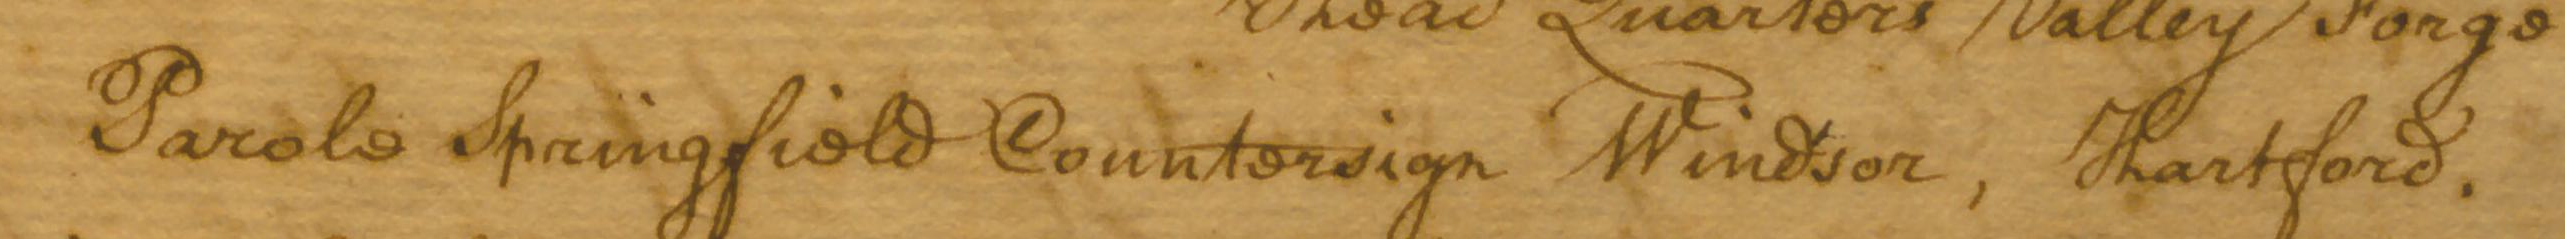Parole Springfield Countersign Windsor, Hartford.
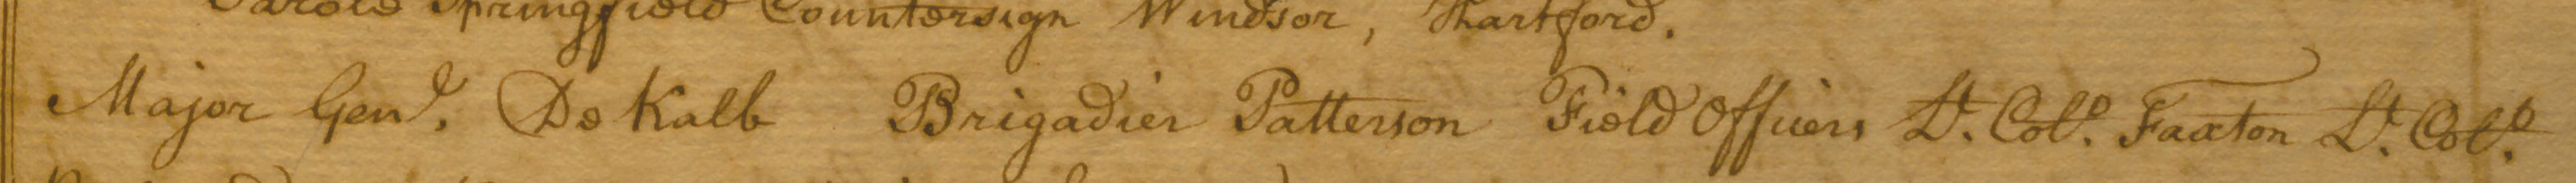Major Gen^l. De Kalb Brigadier Patterson Field Officers L^t. Col^o. Faxton L^t. Col^o.
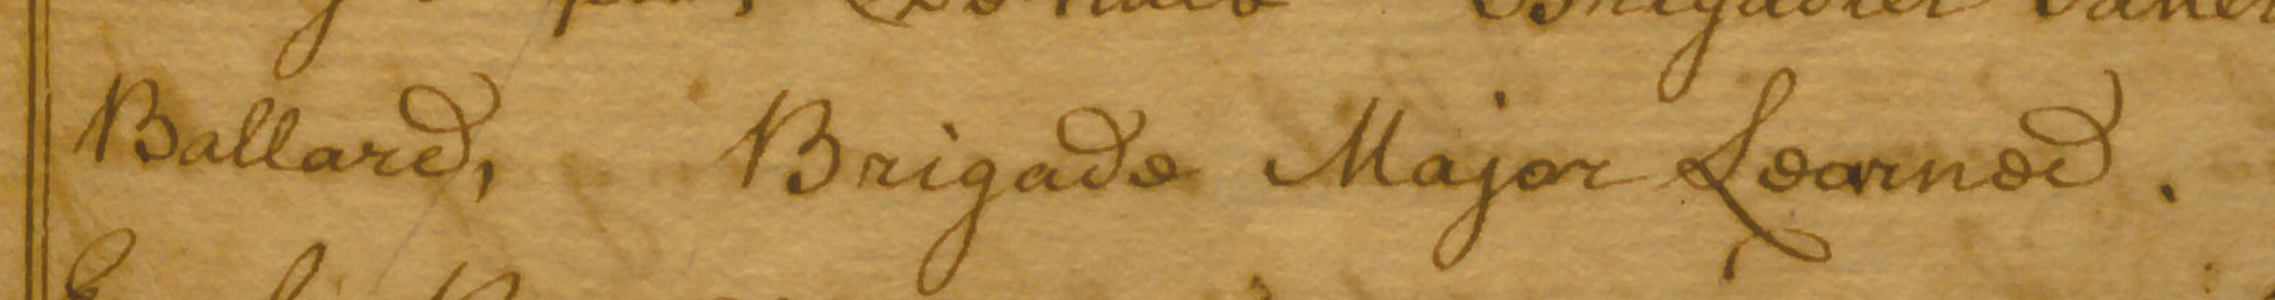Ballard, Brigade Major Learned.
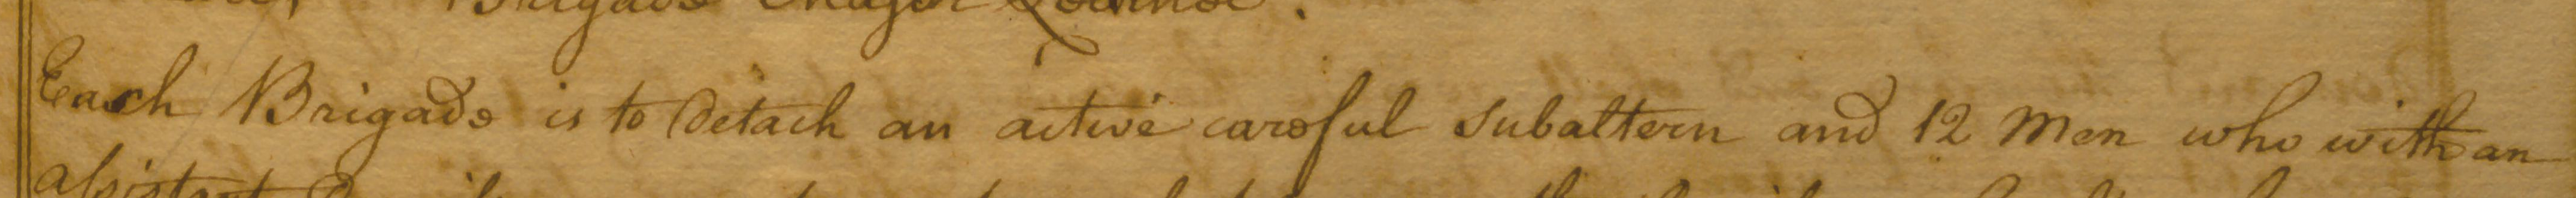Each Brigade is to detach an active careful subaltern and 12 Men who with an
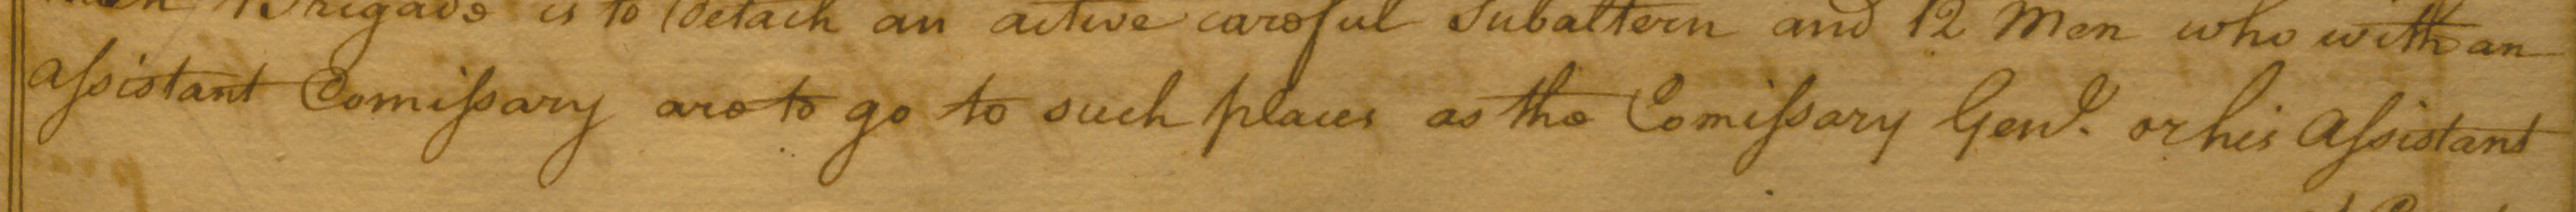assistant Comissary are to go to such places as the Comissary Gen^l. or his Assistant
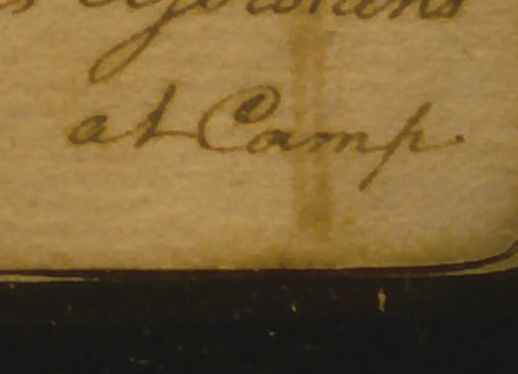at Camp
